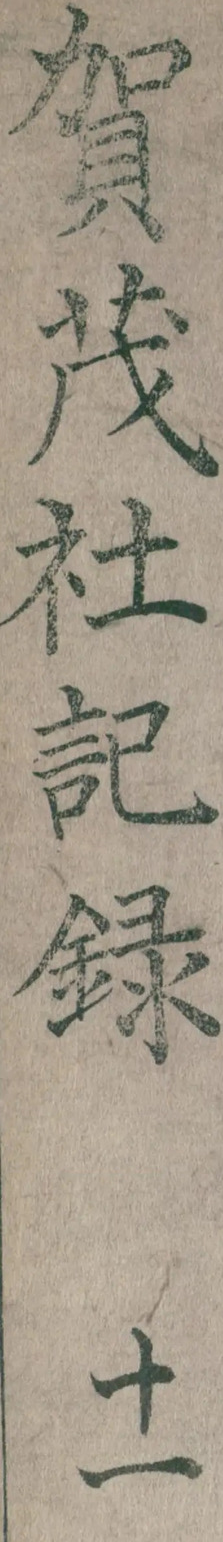賀茂社記録十一

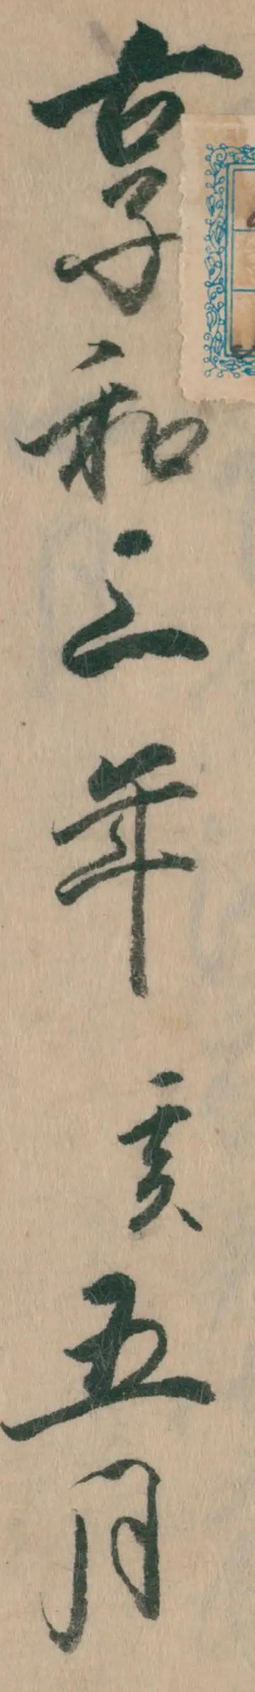享和三年亥五月
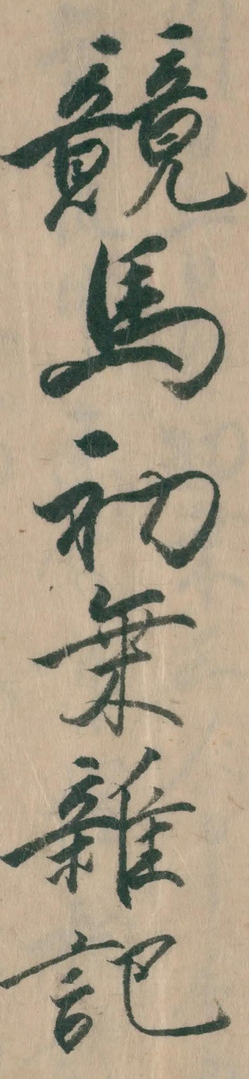競馬初乗雑記

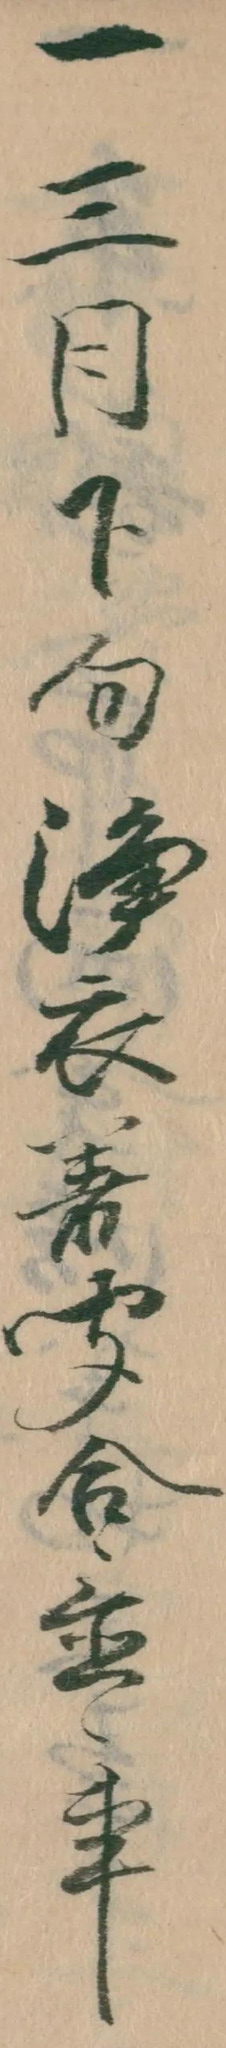一三月下旬浄衣着聞合置候事
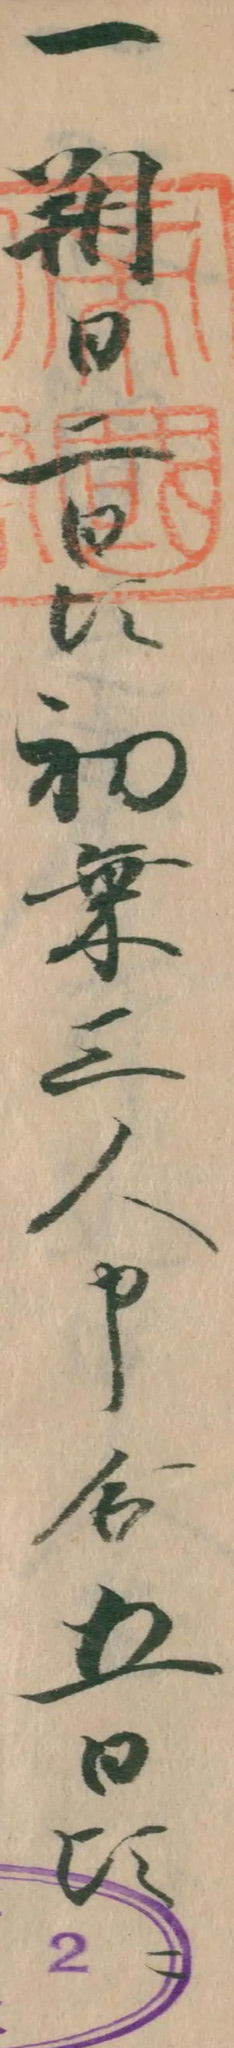一朔日二日頃初乗三人申合五日頃に
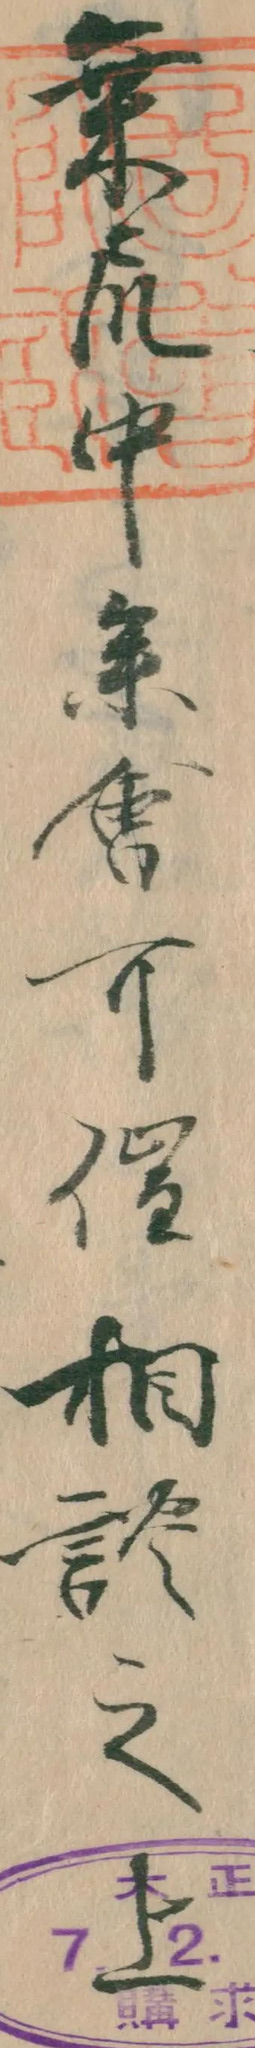乗衆中参会可催相談之上
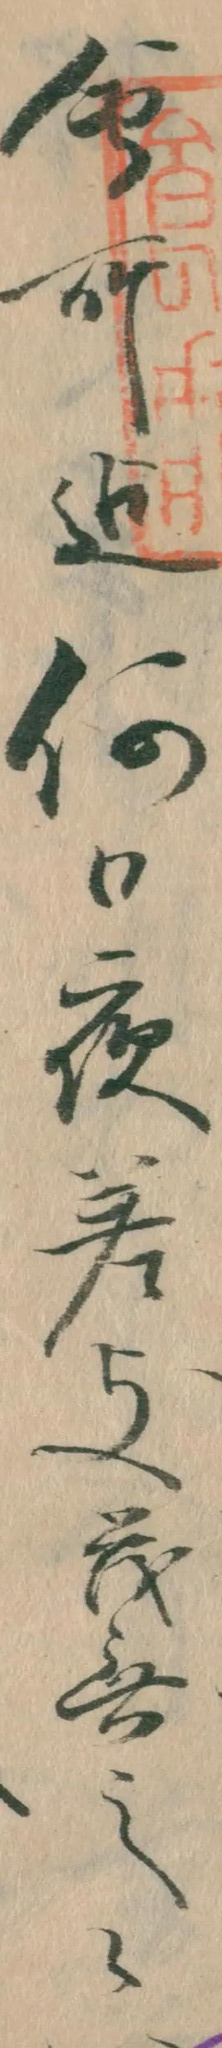會所迄何日夜差支茂無之候はゝ
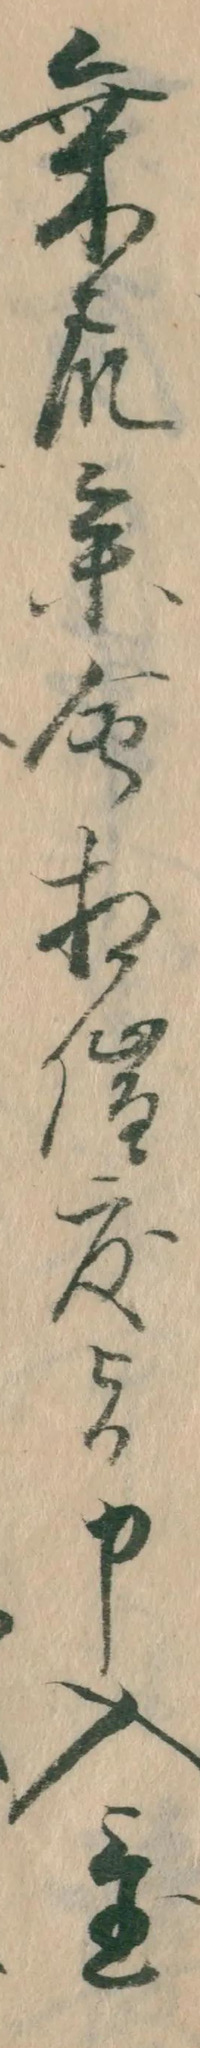乗衆参会相催度旨申入置
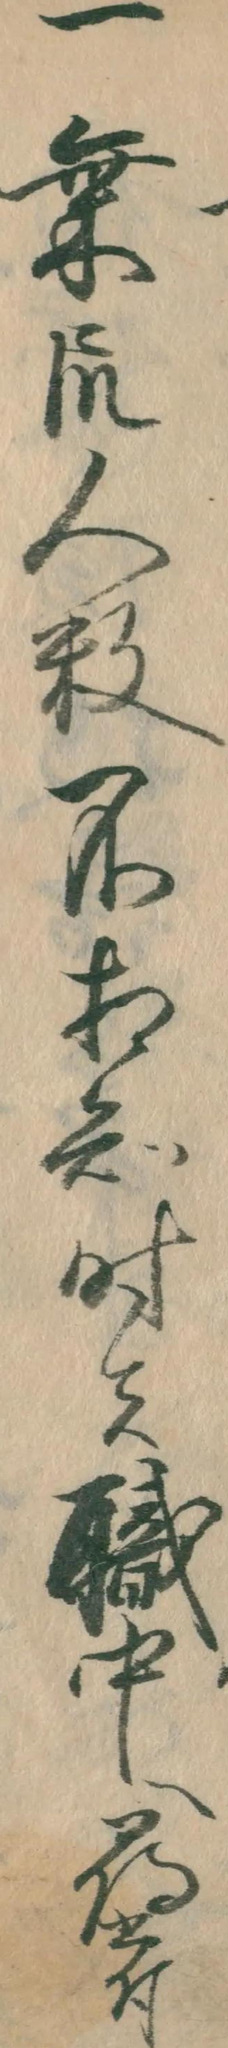一乗衆人数不相知時者職中へ尋書付
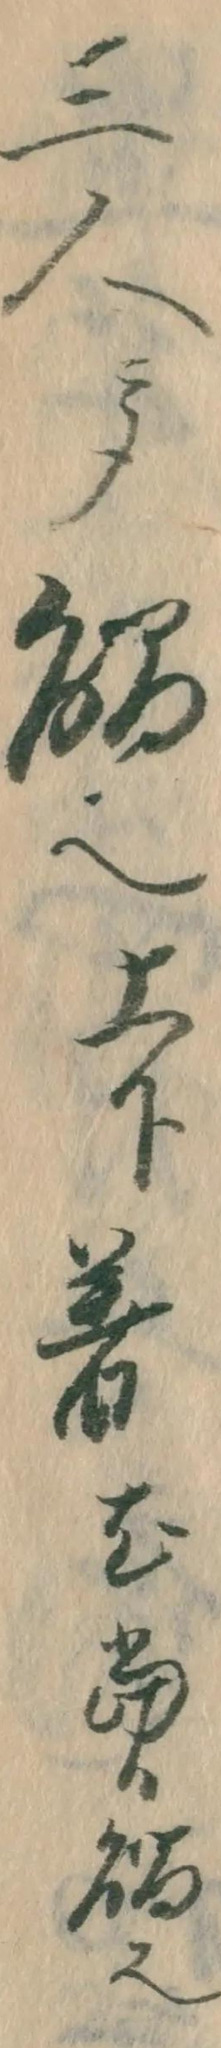三人にして觸也上下着至当日觸也

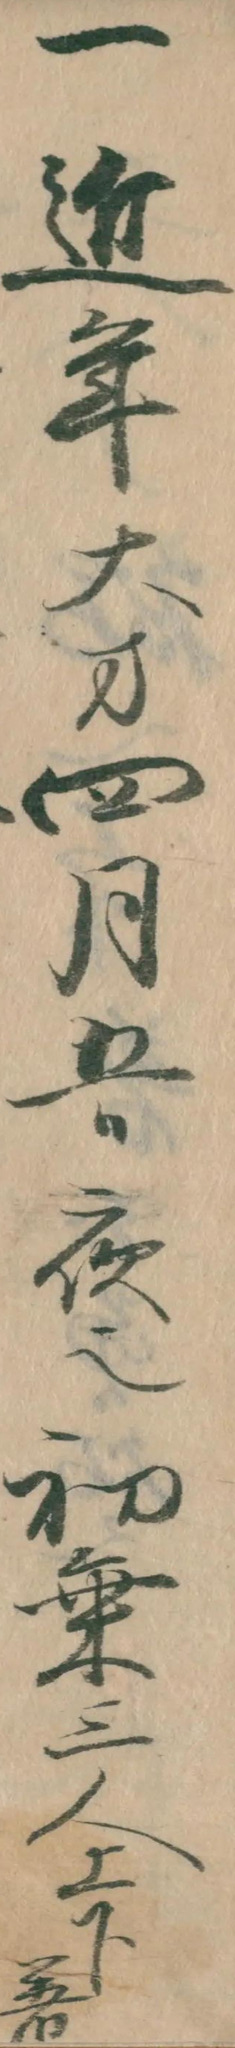一近年大方四月五日夜之初乗三人上下着
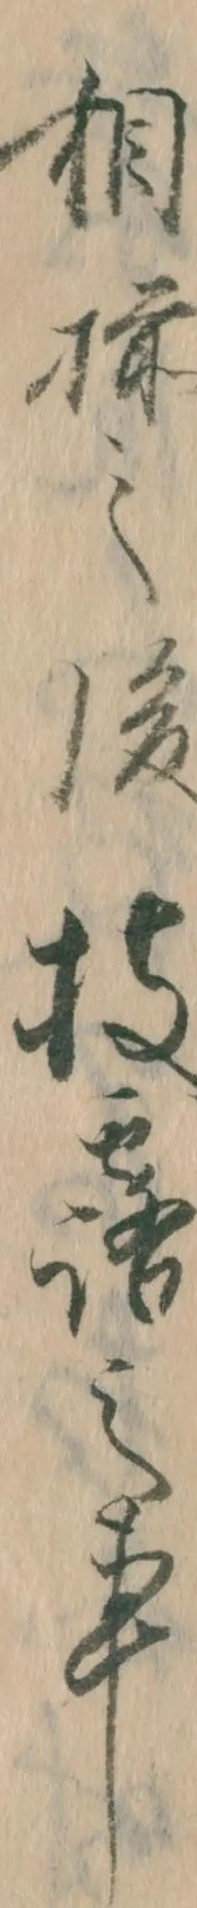相揃之後披露之事
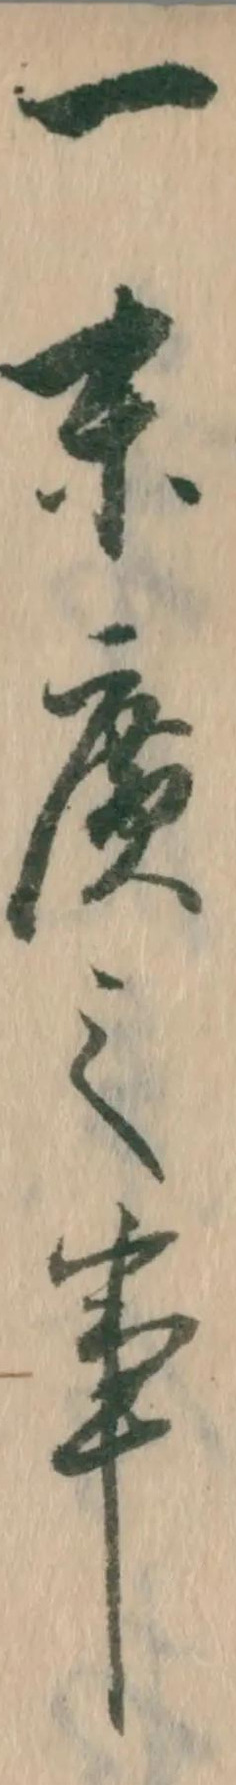一末廣之事
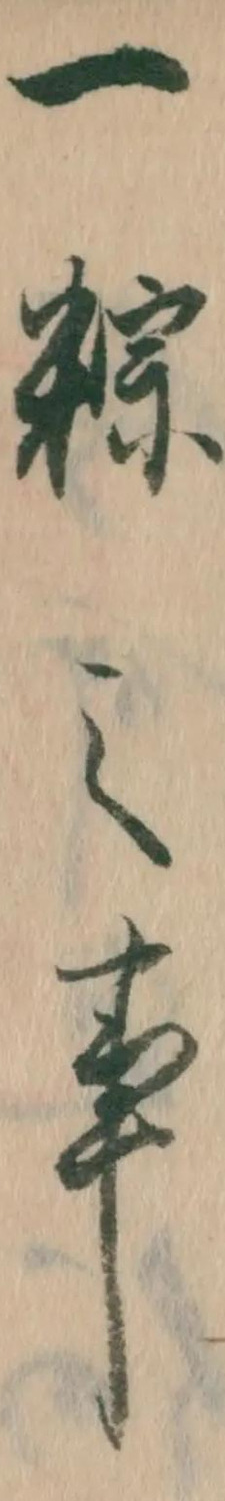一粽之事
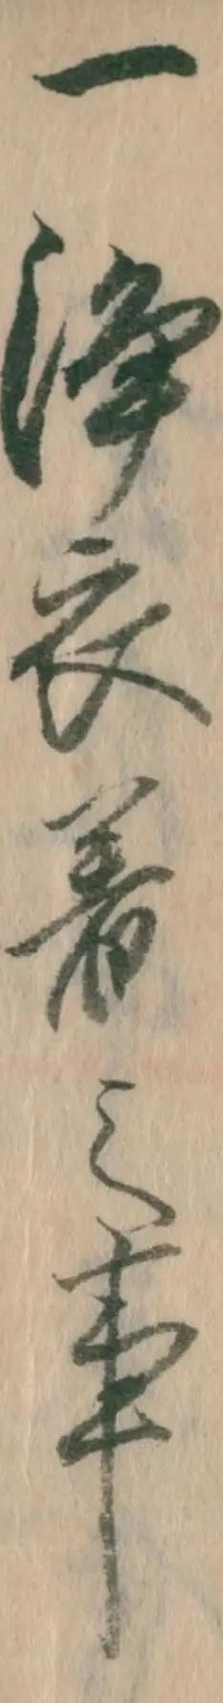一浄衣着之事
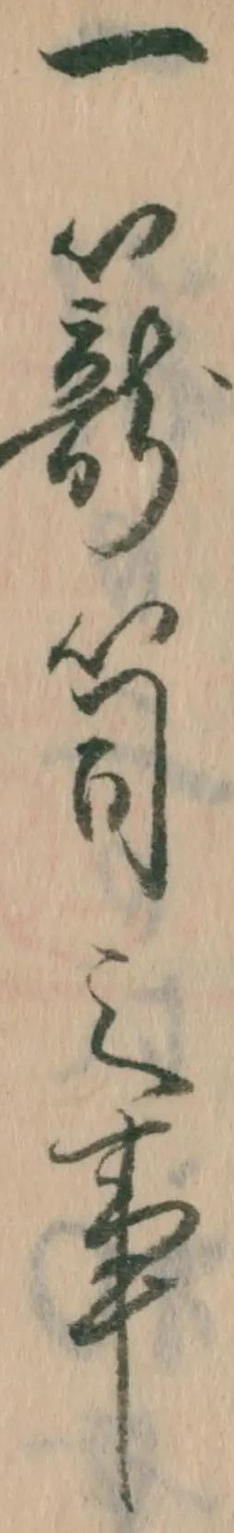一籠笥之事
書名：賀茂社記録. 第11冊
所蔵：国立国会図書館 National Diet Library, JAPAN
